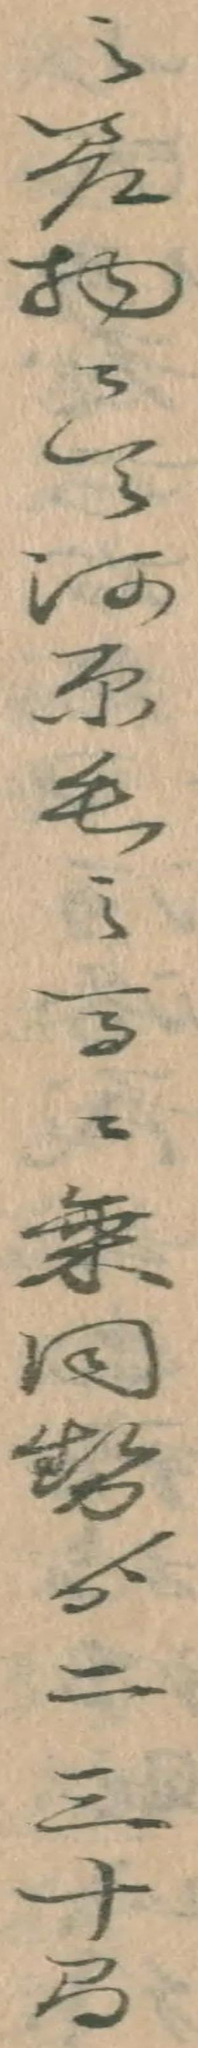之差物にて河原毛之馬に乗同勢ゟ二三十間
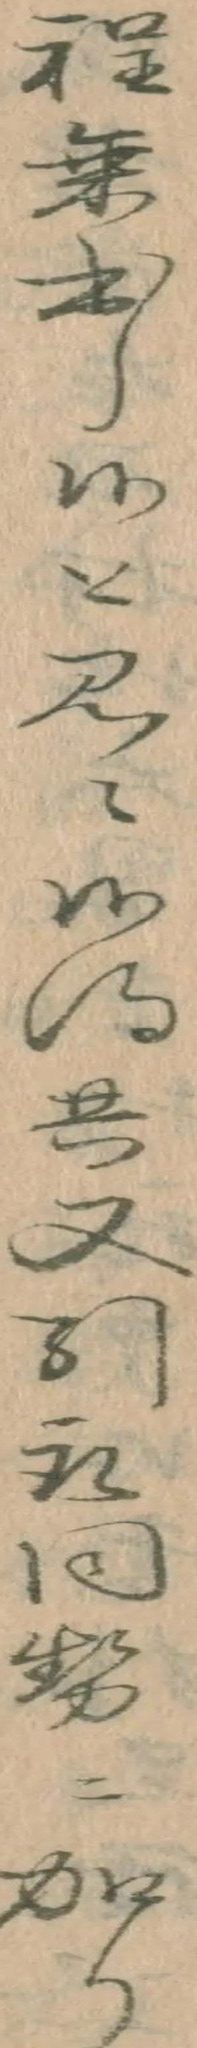程乗出し候と見に候得共又引取同勢に加り
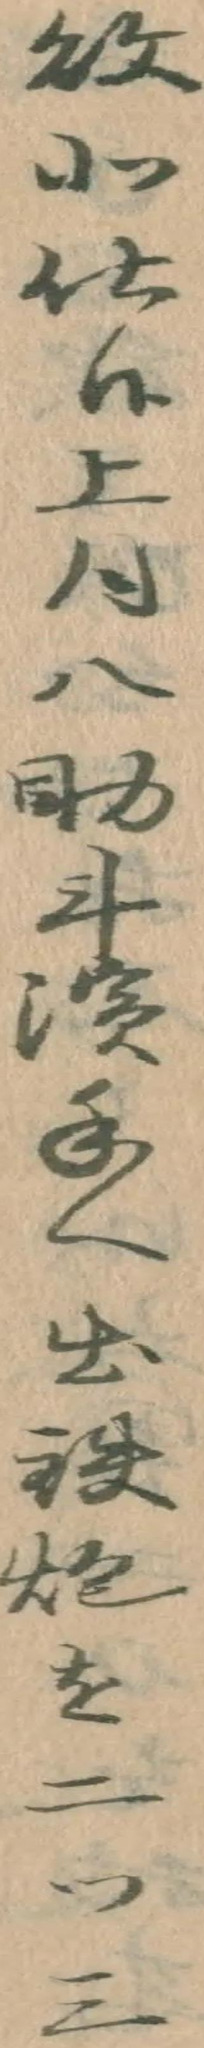敗北仕候上月八助斗浜手へ出鉄炮を二つ三
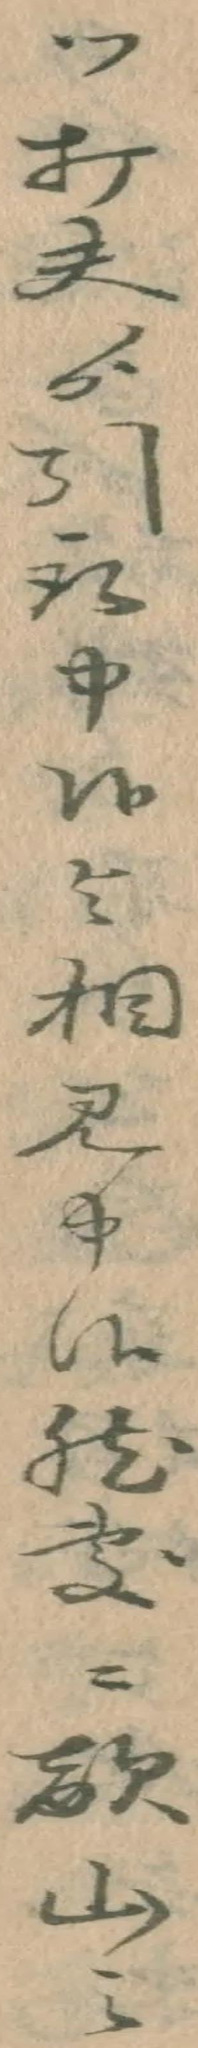つ打夫ゟ引取申候与相見申候然處に敵山之
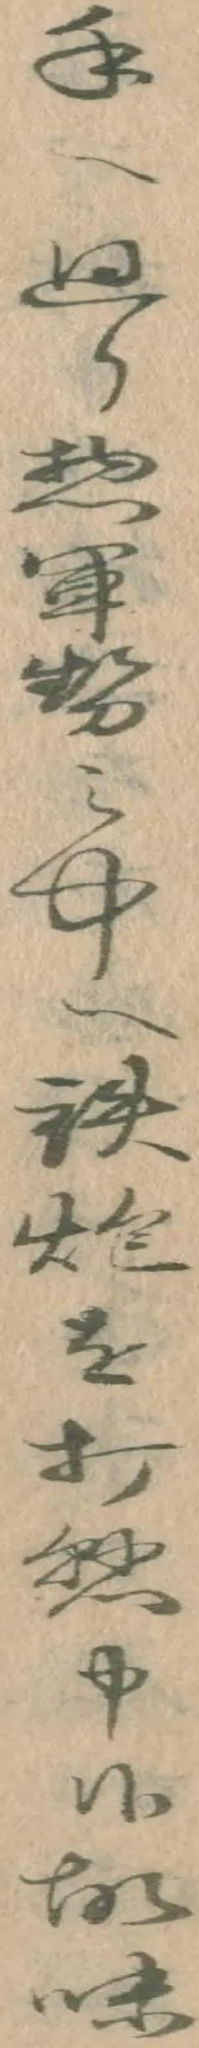手へ廻り惣軍勢之中へ鉄炮を打懸申候故味
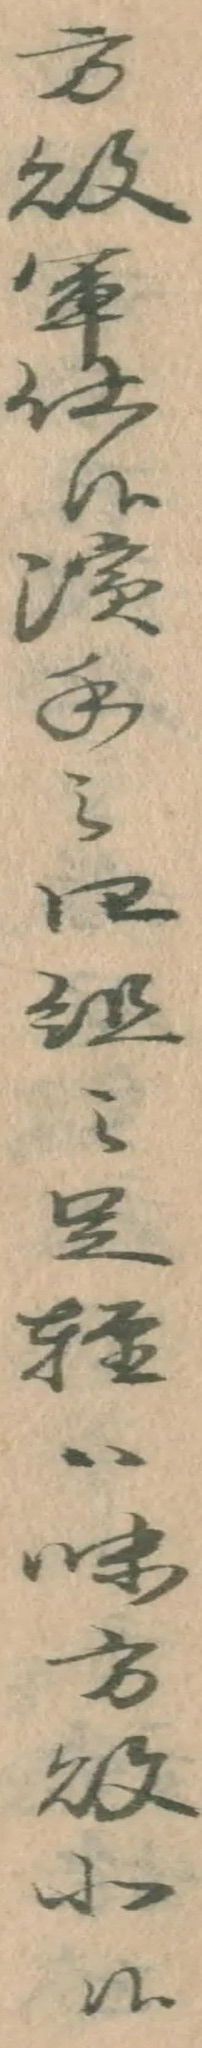方敗軍仕候浜手之四組之足軽は味方敗北候
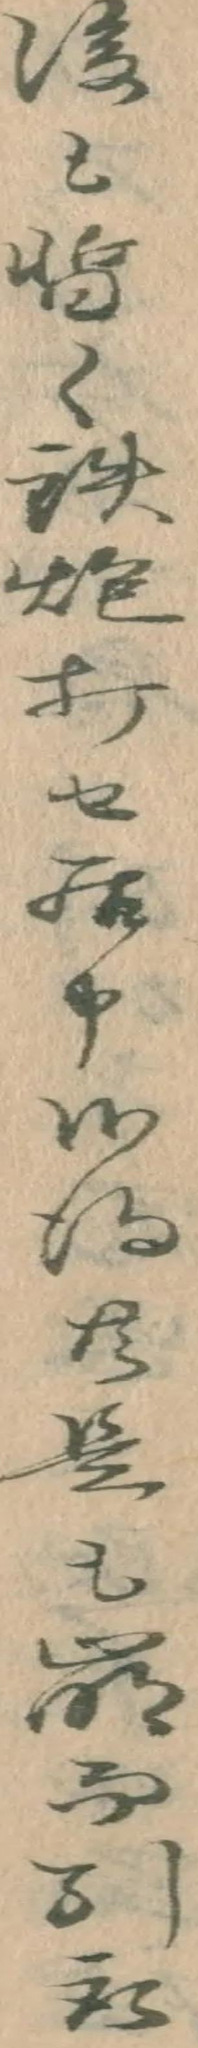後も暫く鉄炮打せ居申候得共是も崩而引取
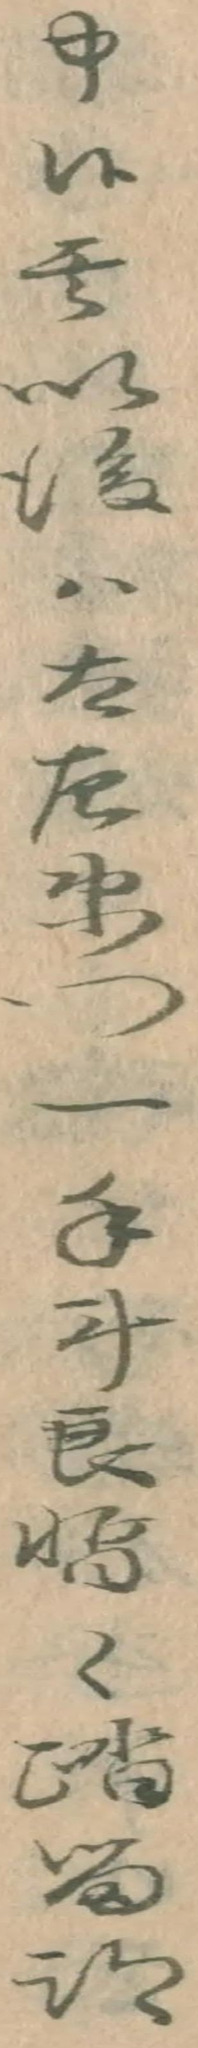申候其以後は太左衛門一手斗良暫く踏留跡
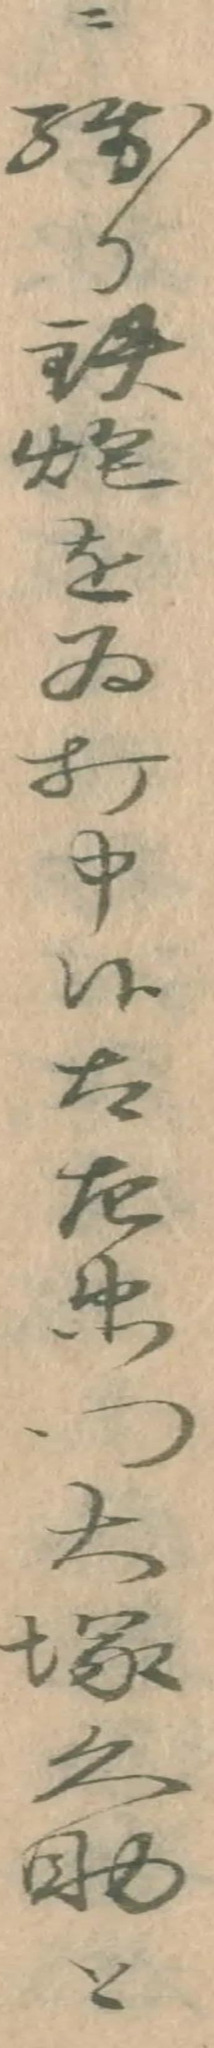に残り鉄炮をゐ打申候太左衛門大塚久助と

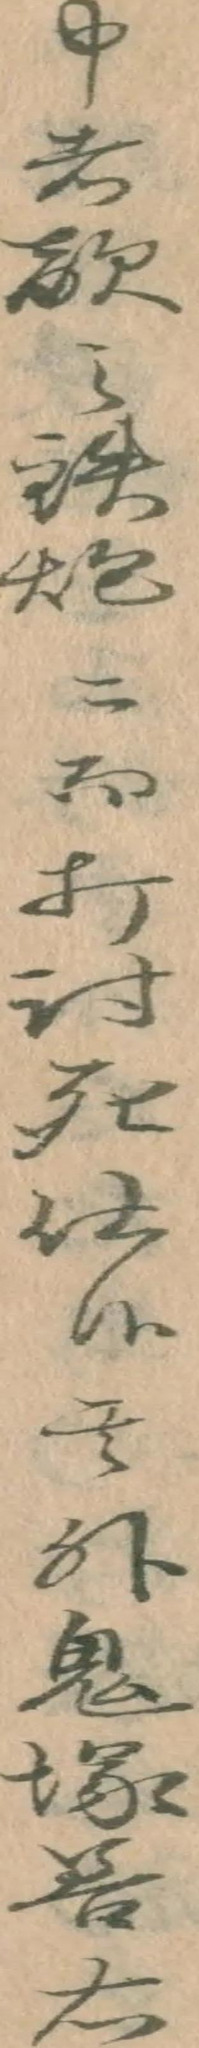申者敵之鉄炮に而打討死仕候其外鬼塚善右
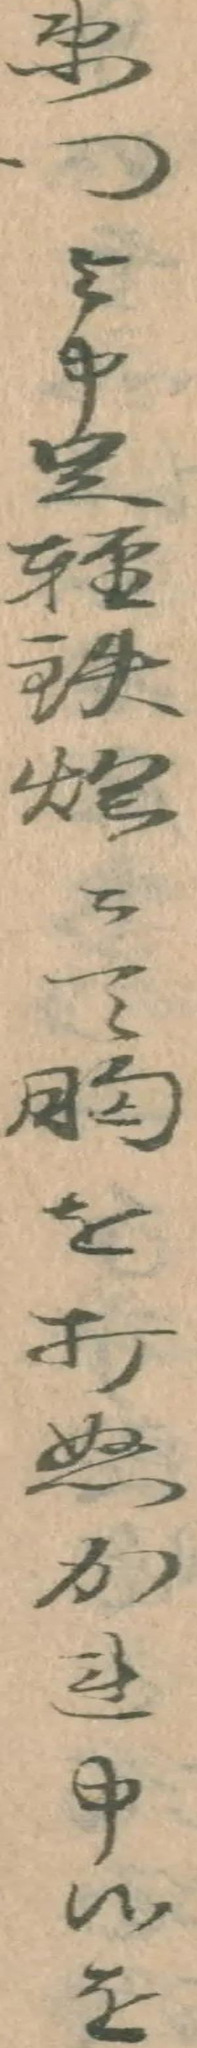衛門与申足軽鉄炮にて胸を打怒か連申候を
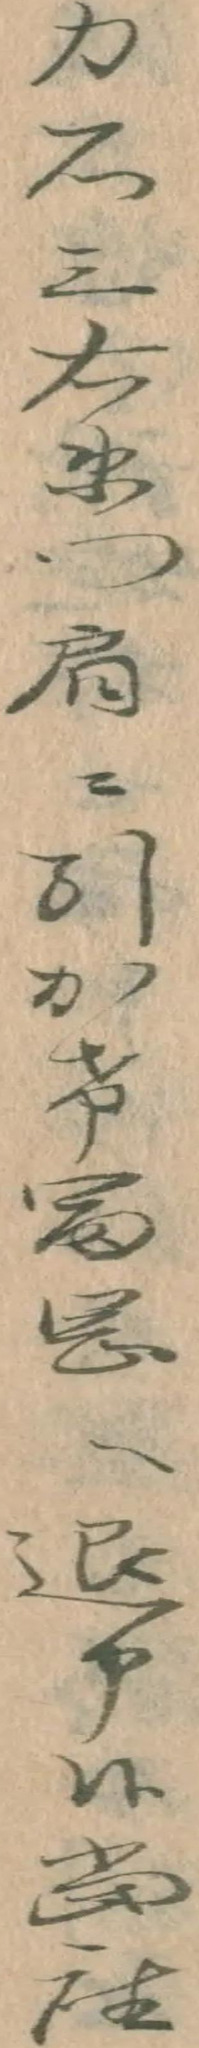力石三右衛門肩に引か希冨岡へ退申候当座
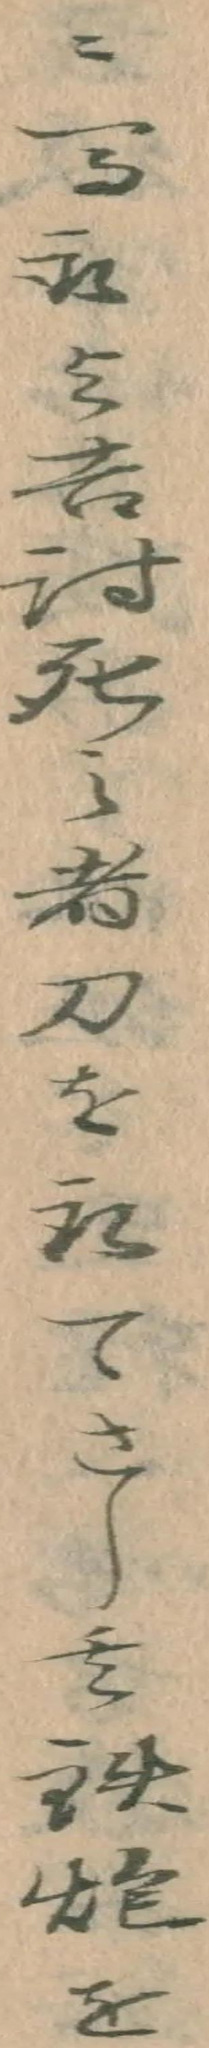に馬取与吉討死之者刀を取てさし其鉄炮を
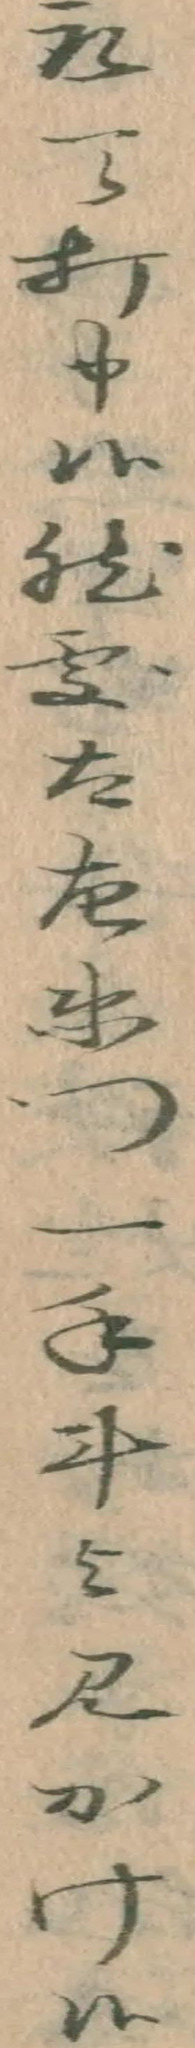取て打申候然處太左衛門一手斗与見かけ候
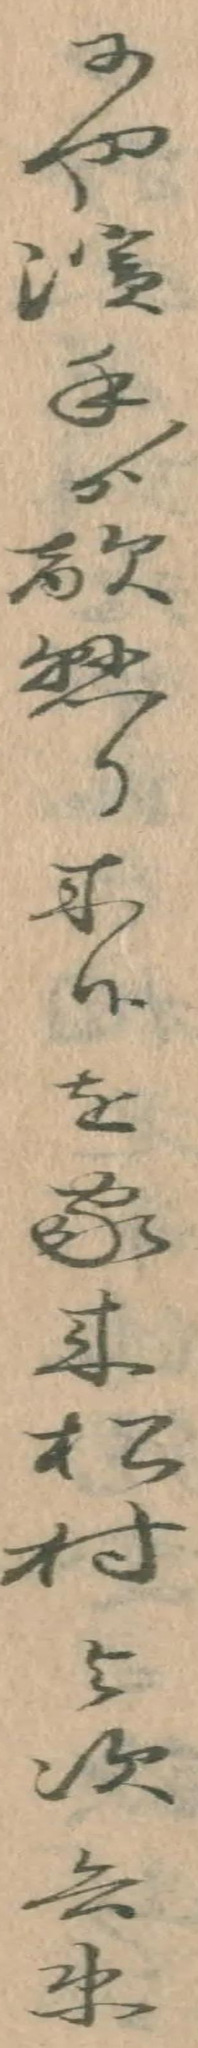かや浜手ゟ敵懸り来候を家来松村与治兵衛
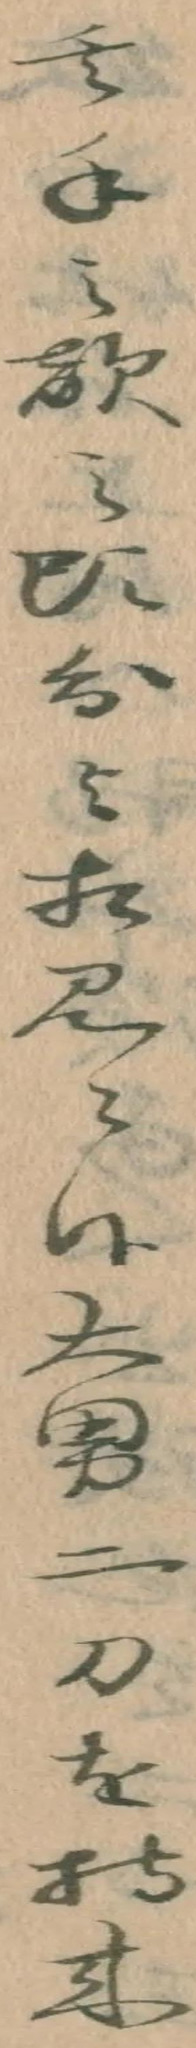其手之敵之頭分与相見に候大男二刀を持来
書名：切支丹御退治記 49巻. [2]
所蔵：国立国会図書館 National Diet Library, JAPAN
